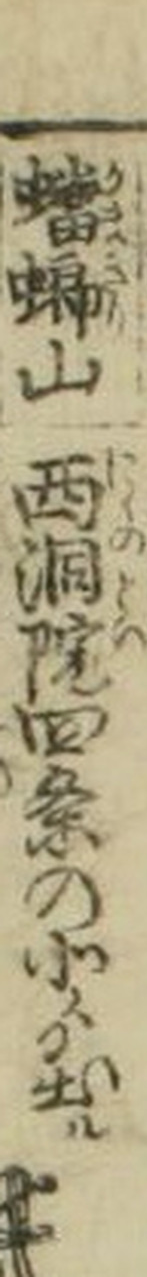蟷螂山西洞院四条の北より出
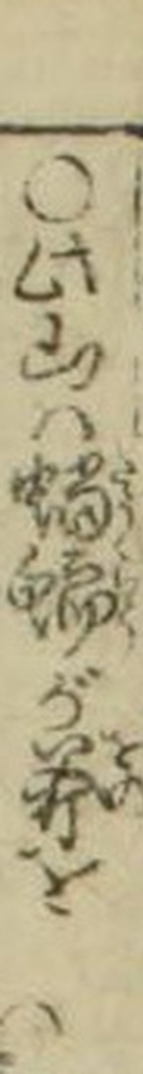〇此山は蟷螂が斧を
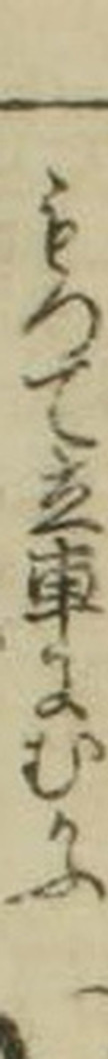もつて立車にむかふ
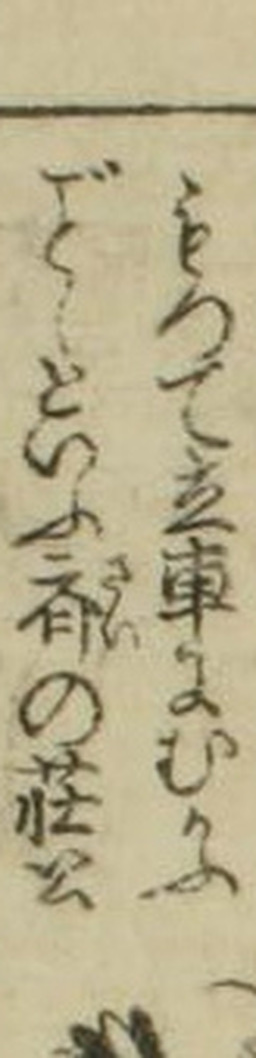ごとしといふ斉の荘公
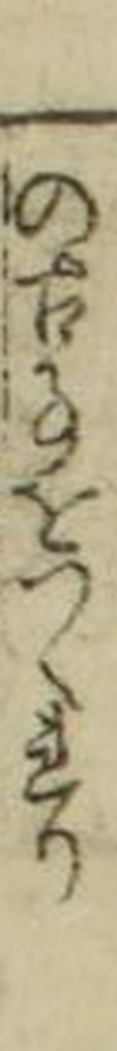の古事をつくれり
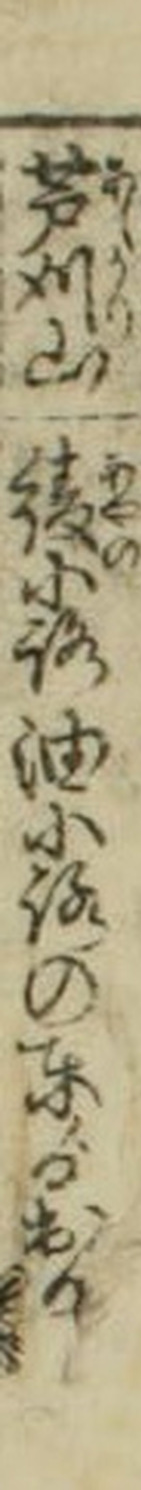芦刈山綾小路油小路の東より出る
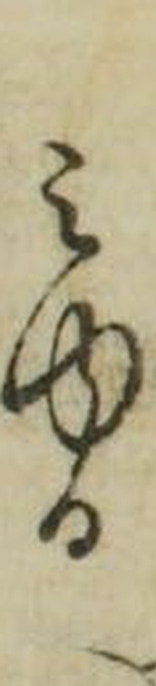みゆる
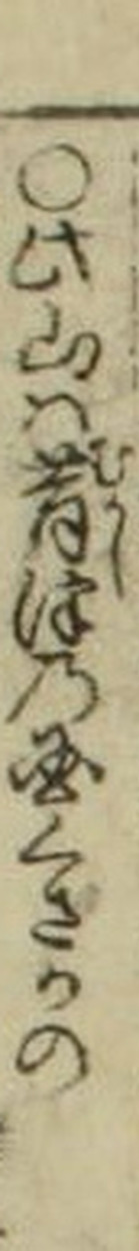〇此山は昔津の国くさかの
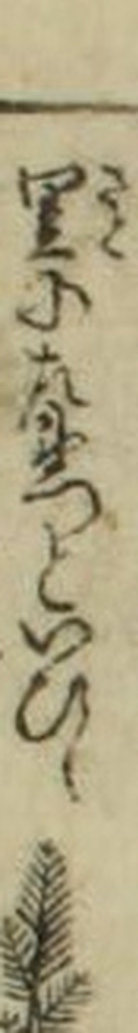里に左衛門といひし
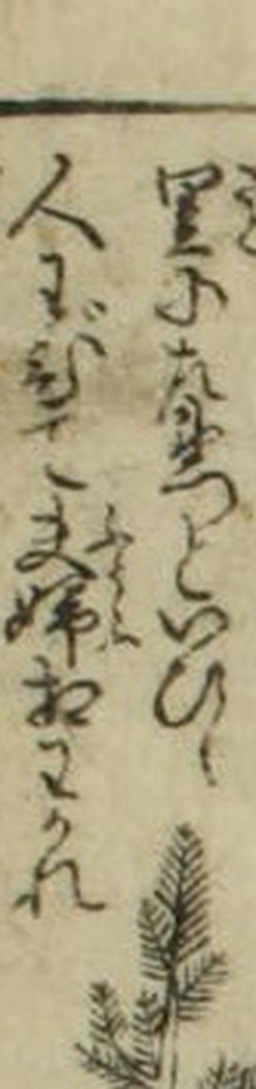人わびて夫婦相わかれ
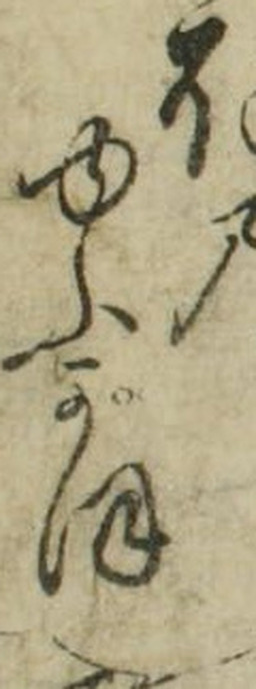ゆうがほ
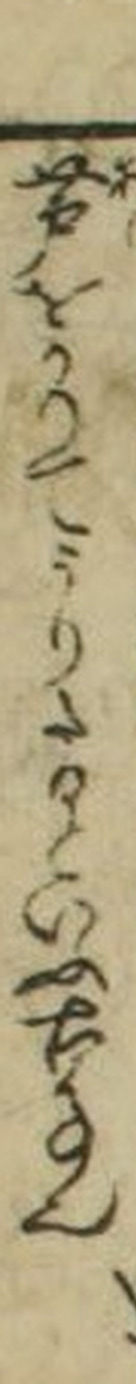芦をかつてうりたるといふ古事也

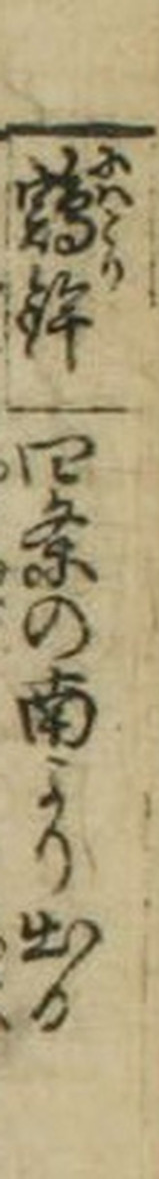鶏鉾四条の南より出る
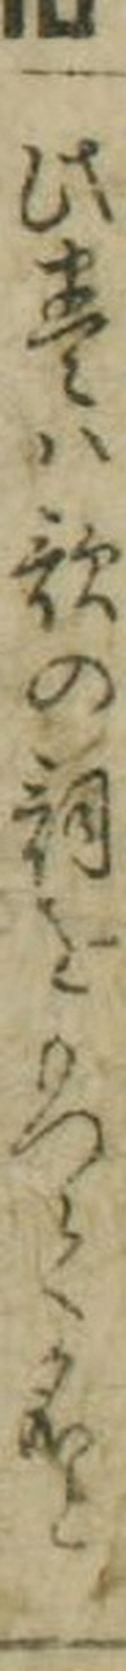此巻は歌の詞をもつて名と
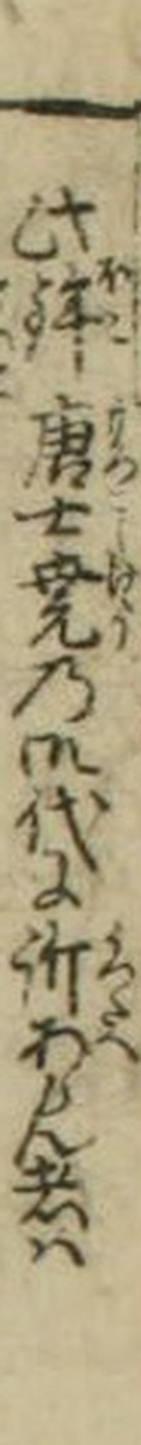此鉾唐土尭の御代に訴あらん者は
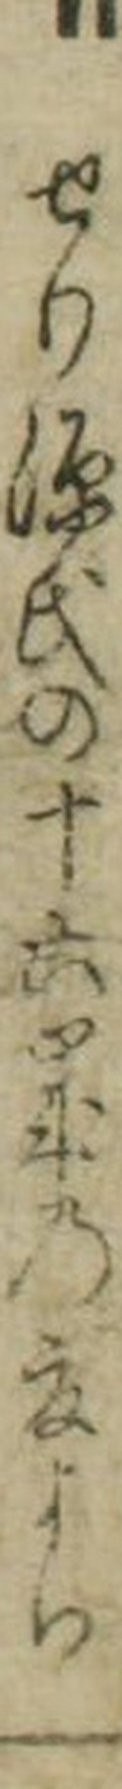せり源氏の十六歳の夏より
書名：女源氏教訓鑑
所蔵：東京学芸大学附属図書館
